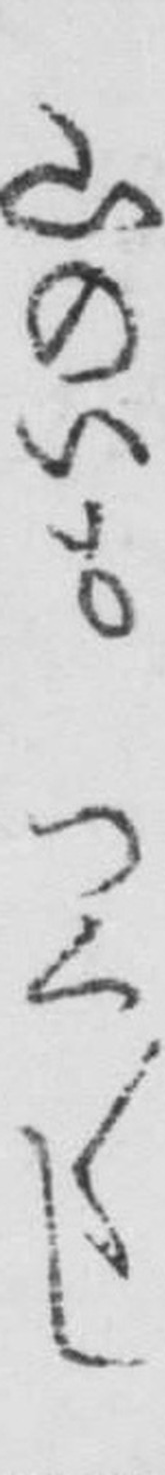山のいもつく〳〵し
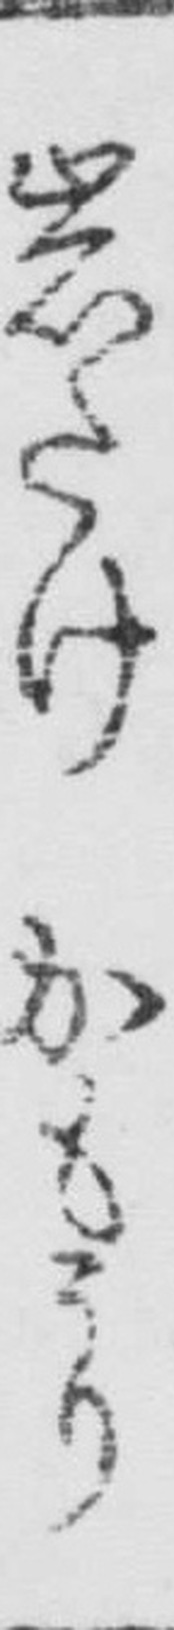岩たけかもうり
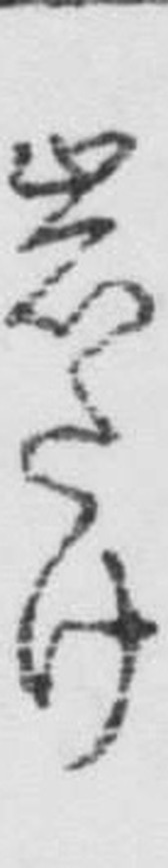椎たけ
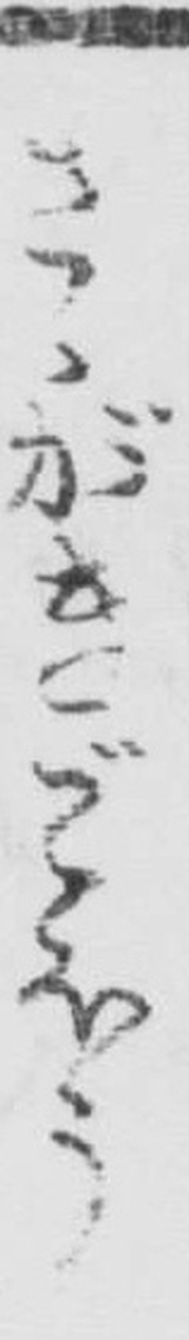さゝがきごほう
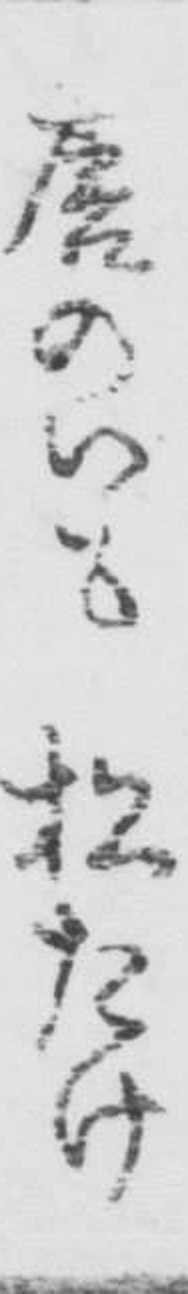唐のいも松たけ
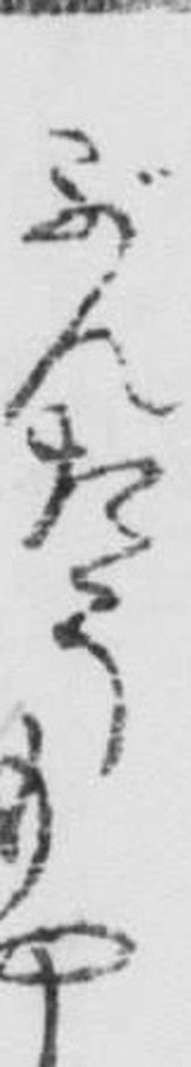ぶんたうもやし
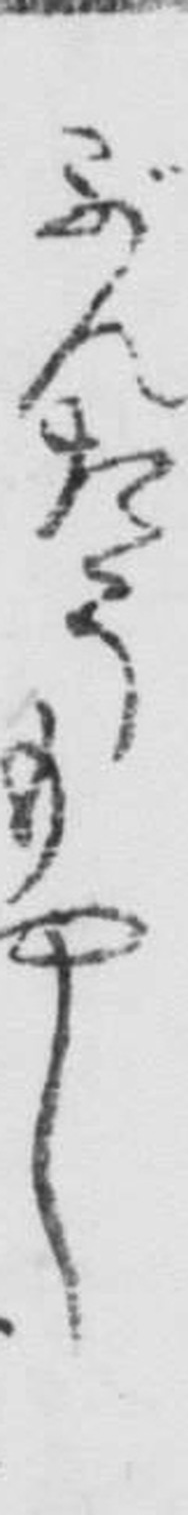ぶんたうもやし
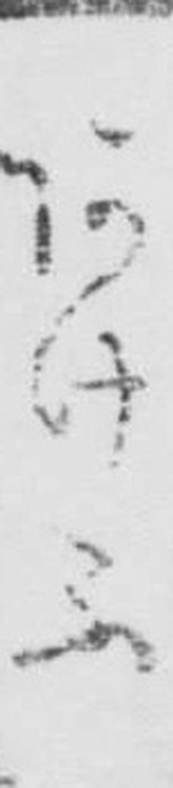あけふ
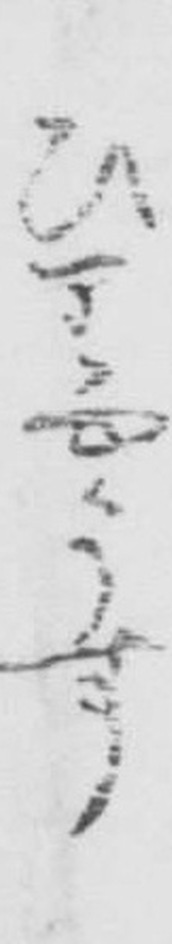ひりやうす
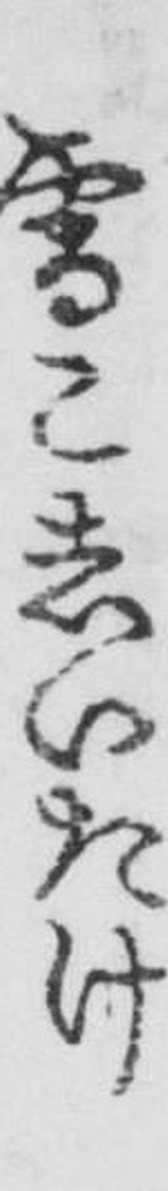雪こしいたけ
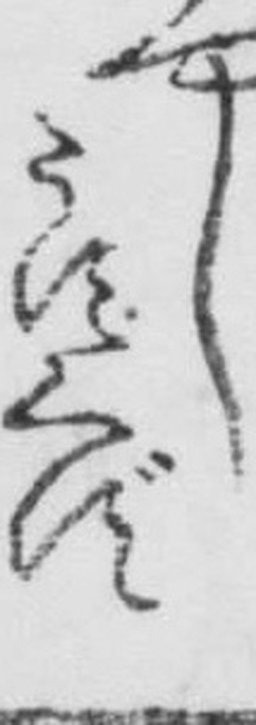うすくず
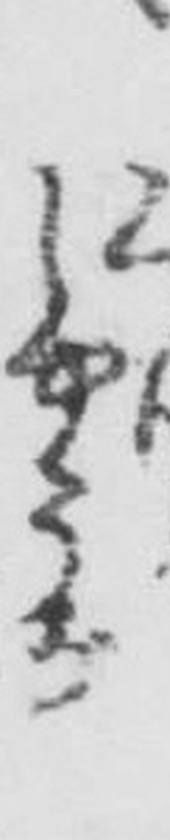しやうが

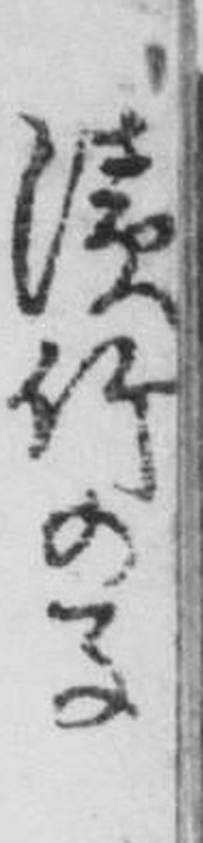漬竹の子
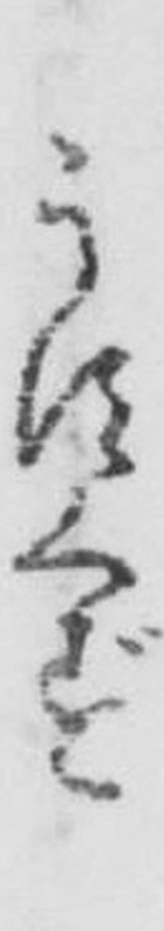うすくず
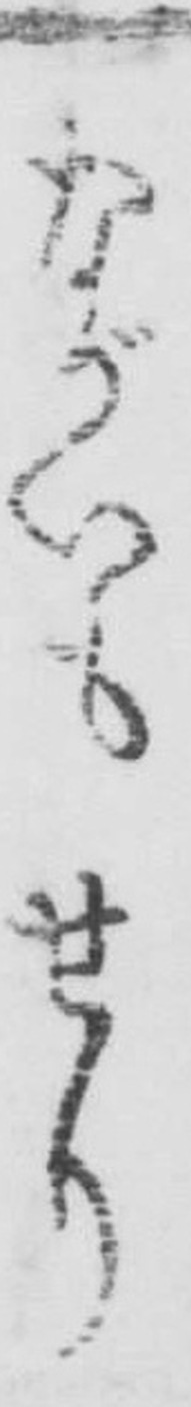ながいもせり
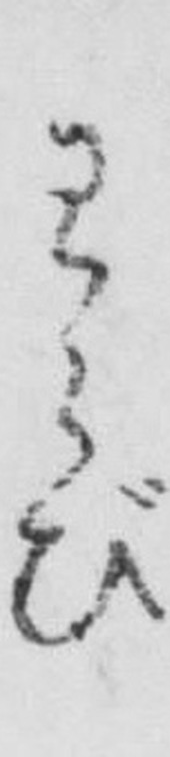わさび
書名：諸家通用/即席料理
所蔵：大阪府立大学学術情報センター 国文学研究資料館
